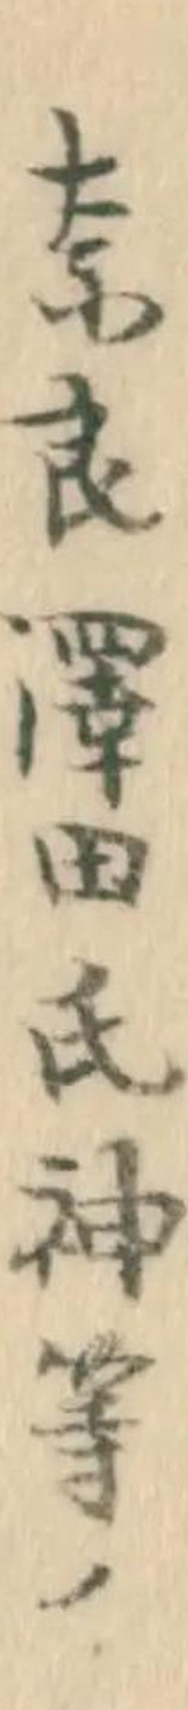奈良沢田氏神等ノ
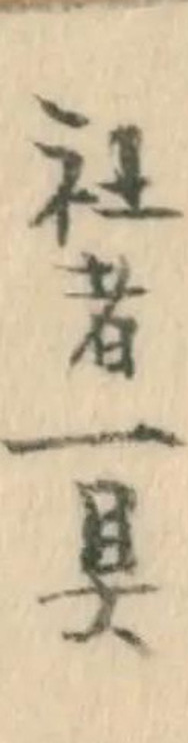社者一具
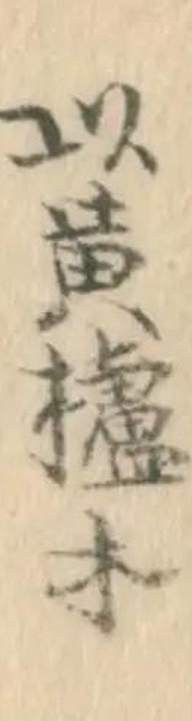以黄櫨木
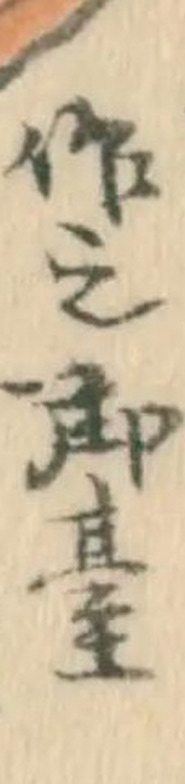作之御台
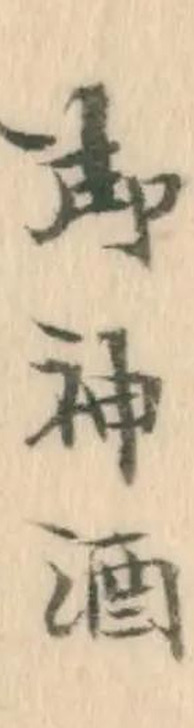御神酒
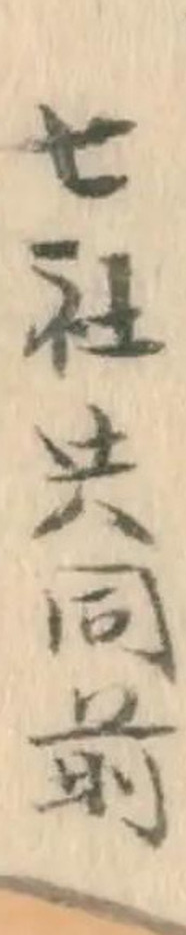七社共同前
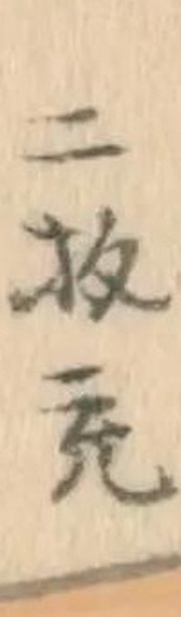二枚充
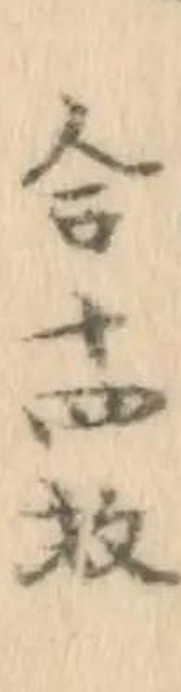合十四枚
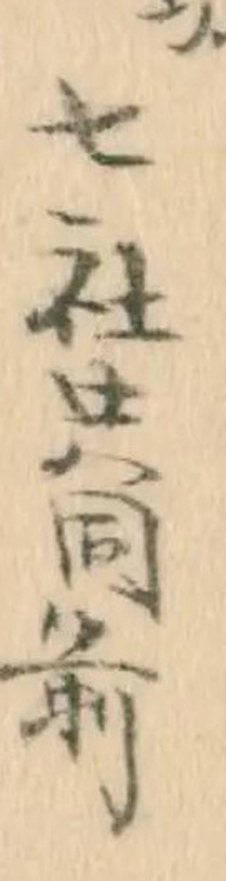七社共同前
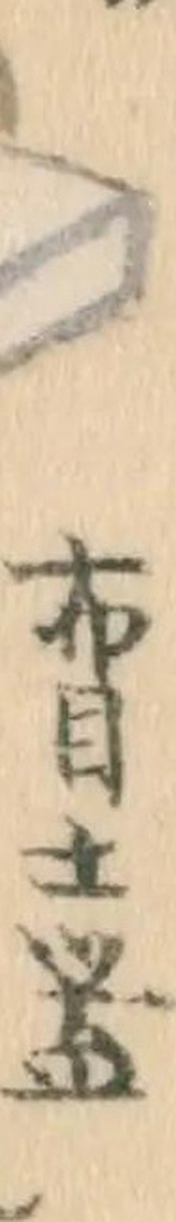布目土器
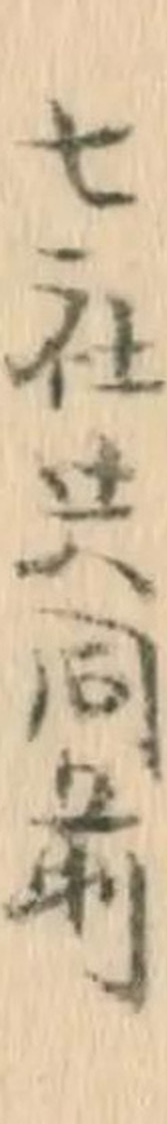七社共同前
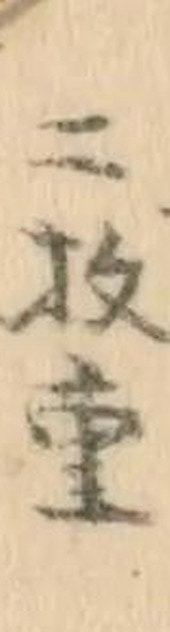二枚重
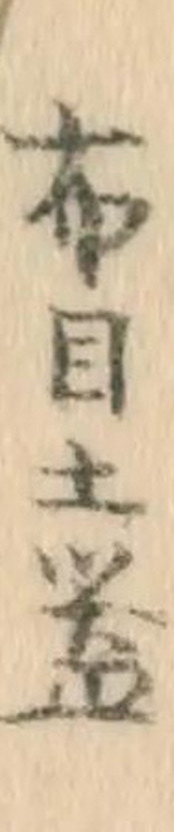布目土器
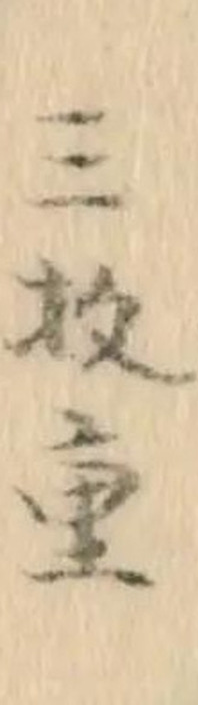二枚重
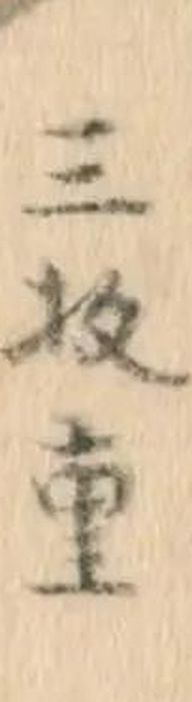二枚重
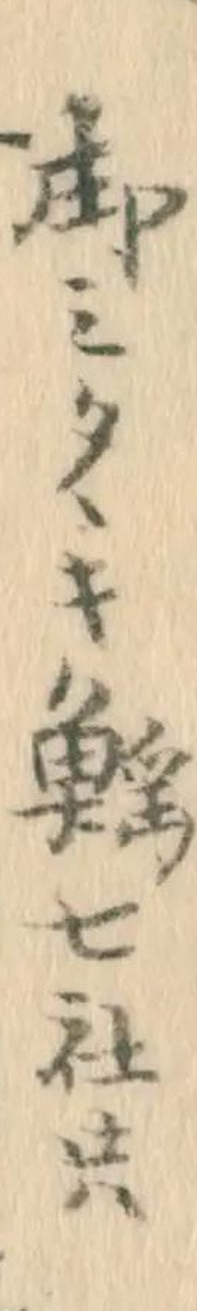御ミタヽキ鰩七社共
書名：葵御祭供進之神饌諸品色目書
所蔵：国立国会図書館 National Diet Library, JAPAN
